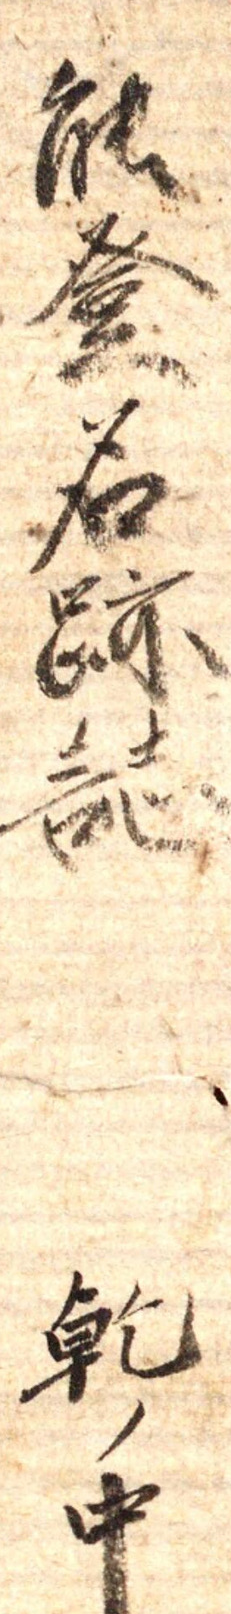能登名跡誌乾ノ中

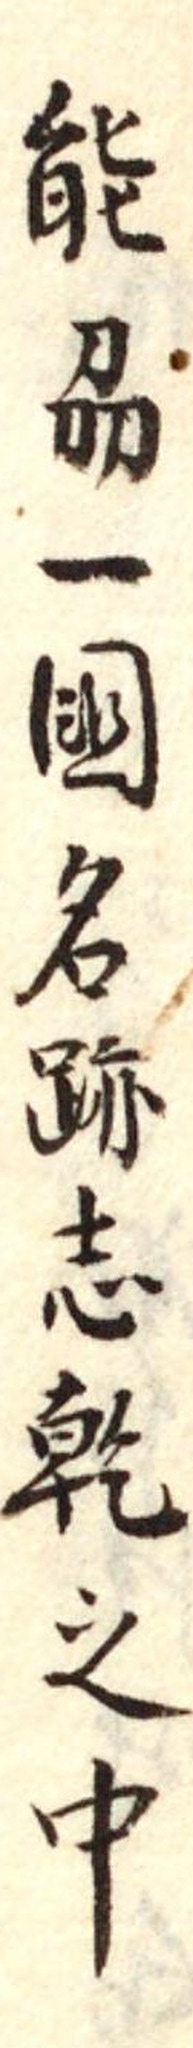能州一国名跡志乾之中
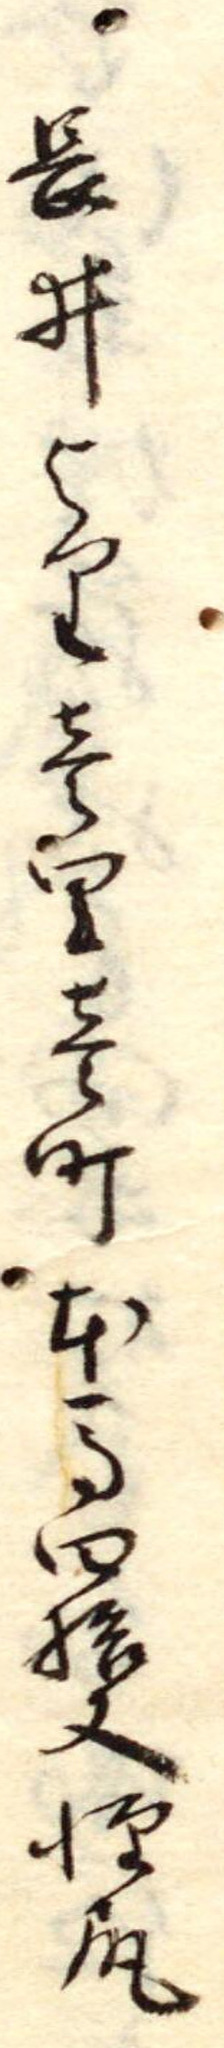長井より壱里壱町本馬四拾文軽尻
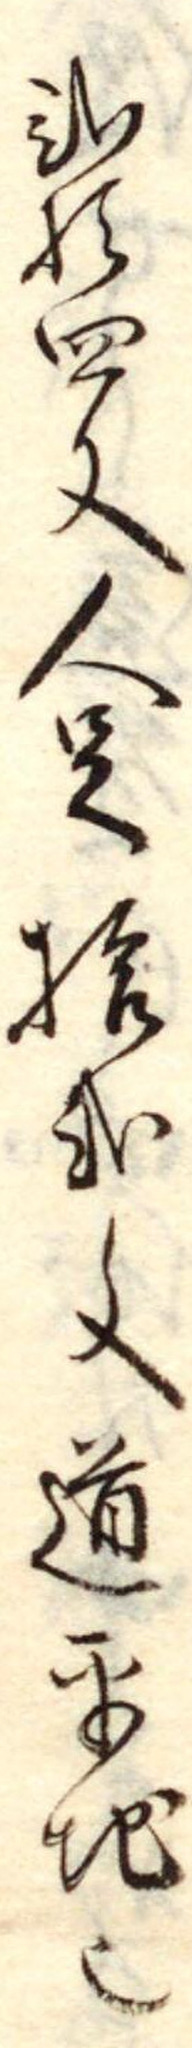輪嶋弐拾四文人足拾弐文道平地也
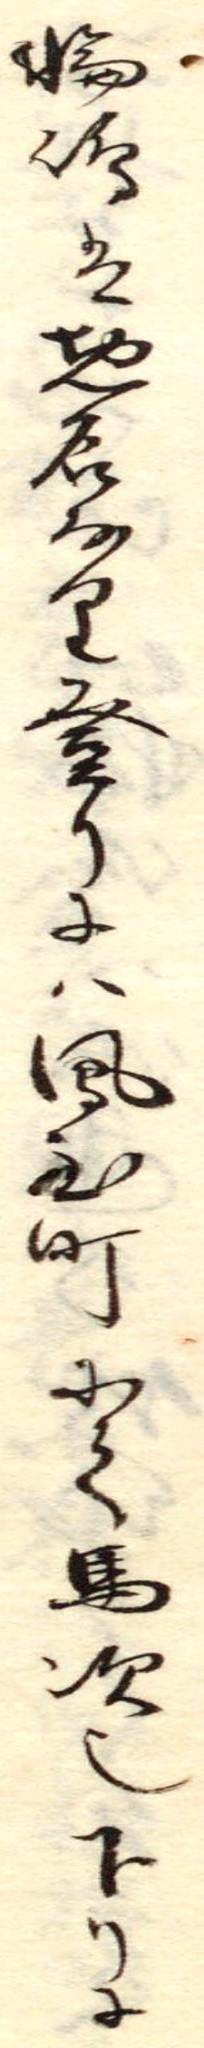輪嶋は惣名なり登りには鳳至町にて馬次也下りに
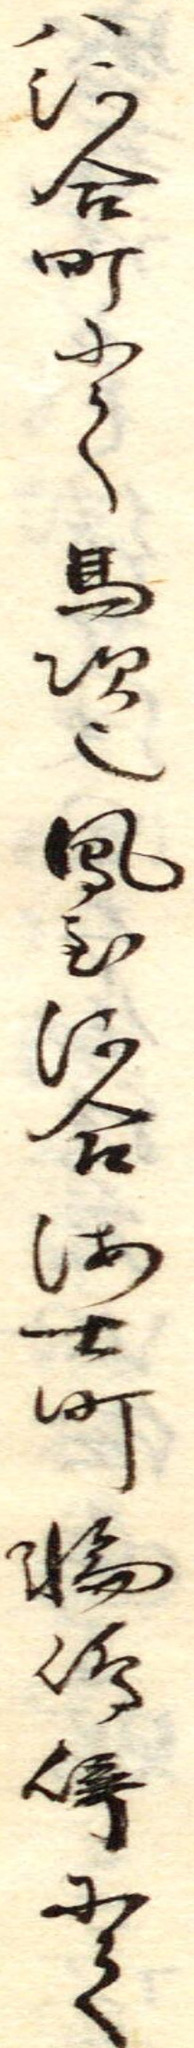は可合町にて馬次也鳳至河合海士町輪嶋崎にて
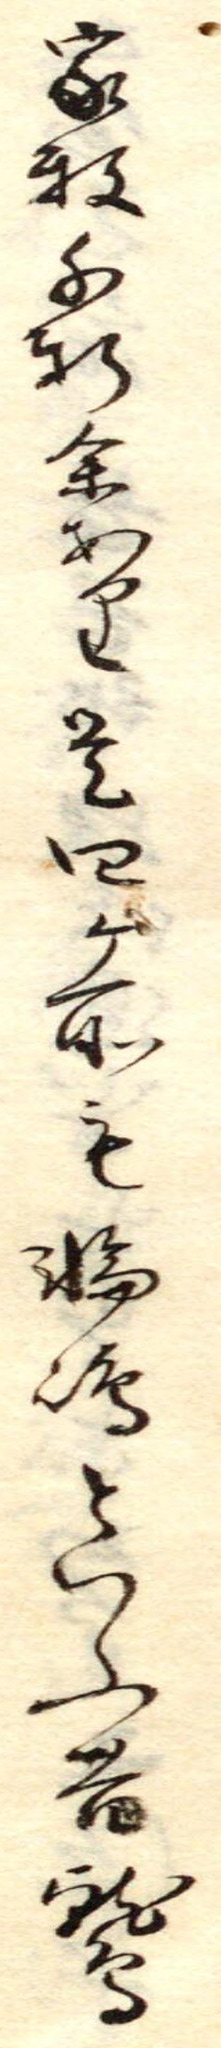家数千軒余あり是四ヶ所も輪嶋といふ昔鷲
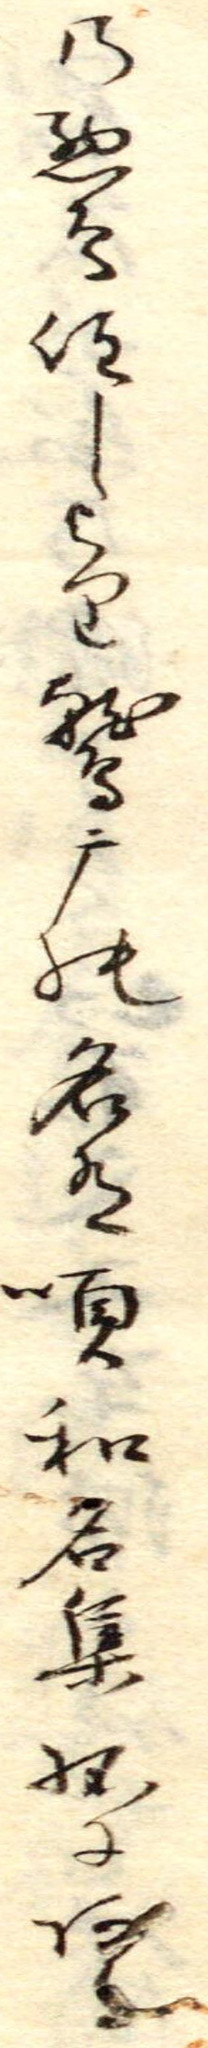の悪鳥住しより鷲魔の名有項和名集抔にあり

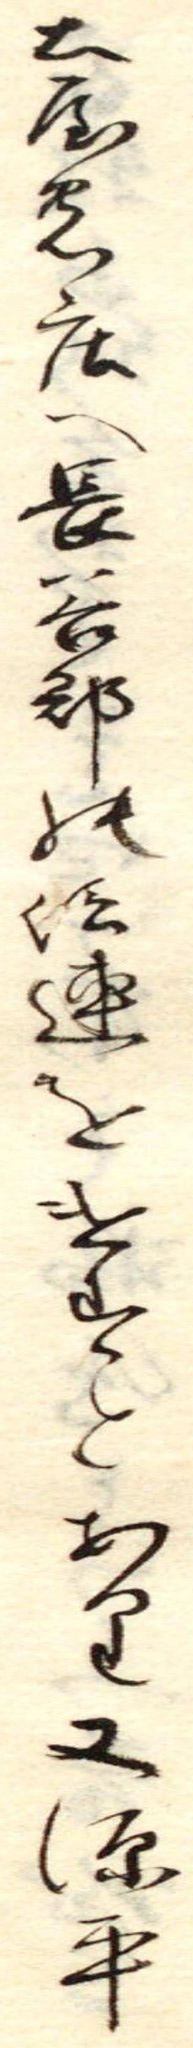土屋の庄へ長谷部の信連を遣すとあり又源平
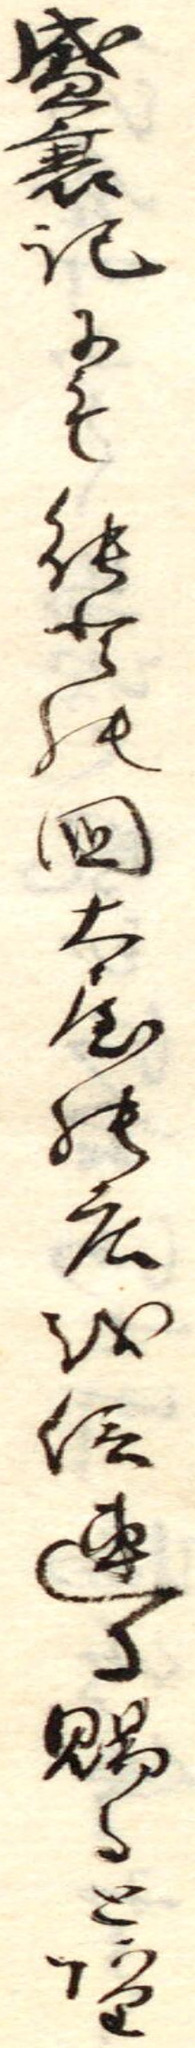盛衰記にも能登の国大屋の庄を信連に賜るとあり
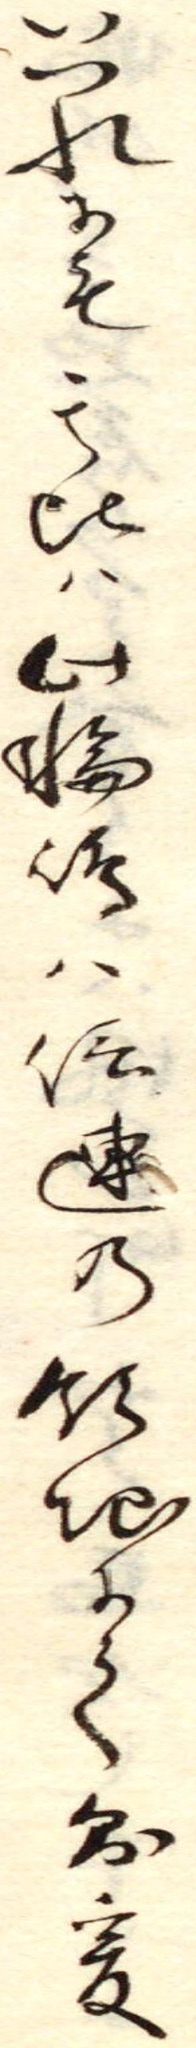いつれにも其比は此輪嶋は信連の領地にて則爰
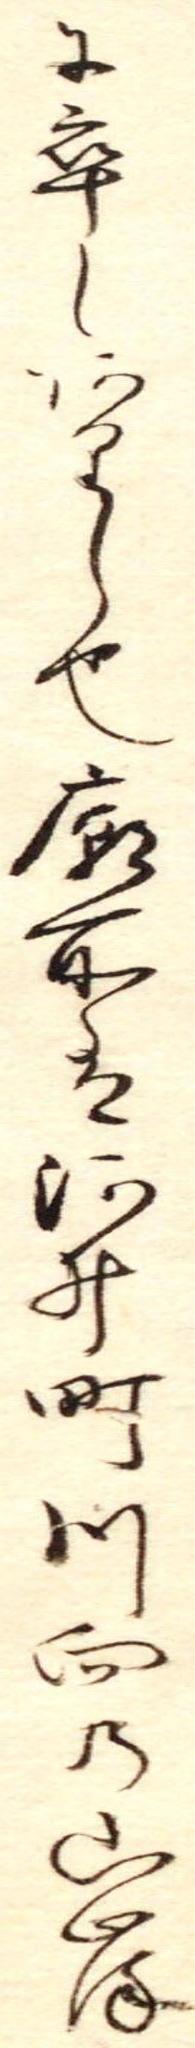に卒しありし也廟所は河井町川向の山岸
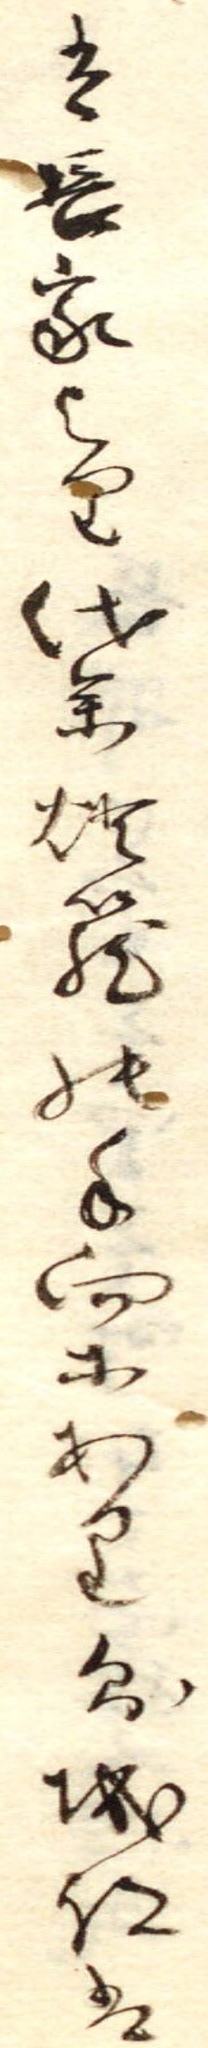は長家より代参燈籠の手向等あり則城跡は
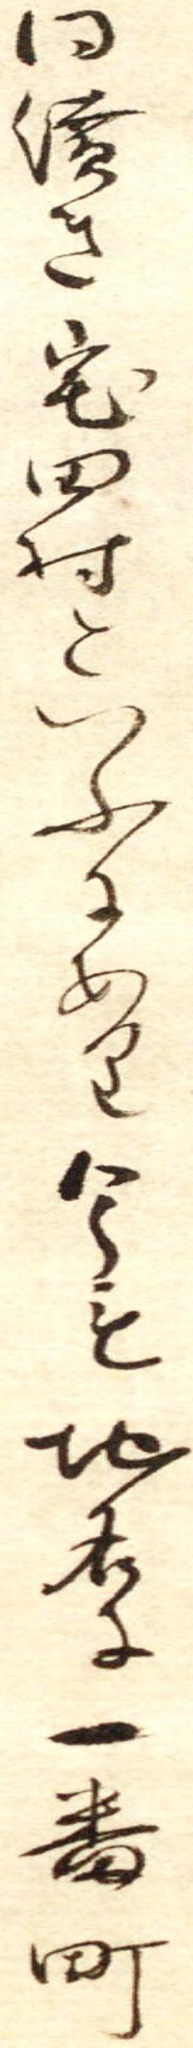同続き宅田村といふにあり今も地名に一番町
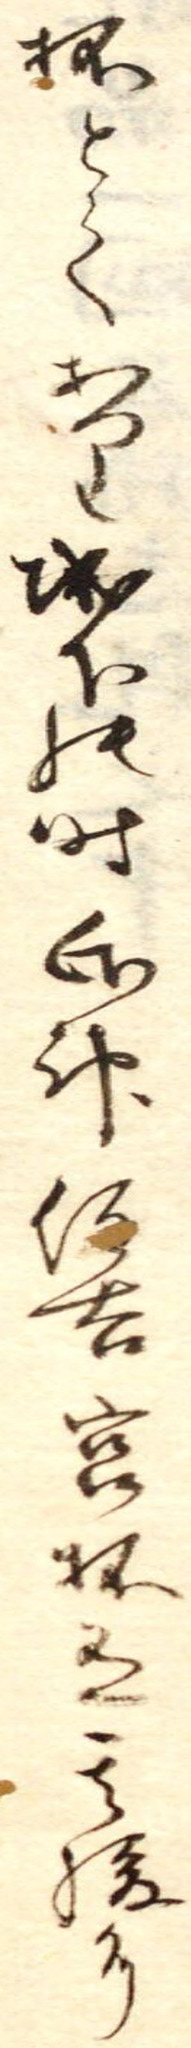抔とてあり城下の時氏神住吉宮抔有其後に
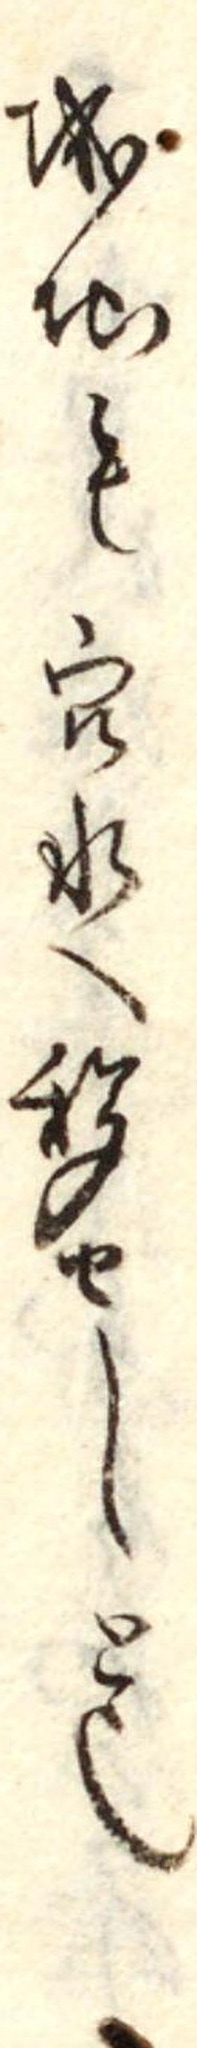城地も穴水へ移せしと也
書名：能登名跡誌
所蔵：Ishikawa Prefectural Library
